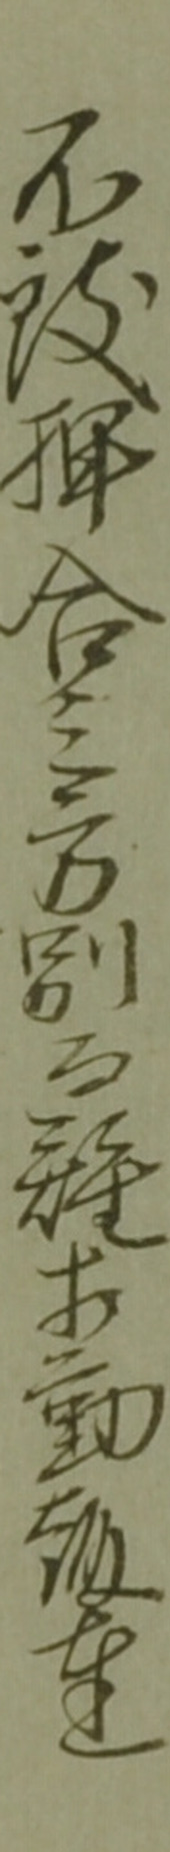不致押合之方別而難相勤趣達
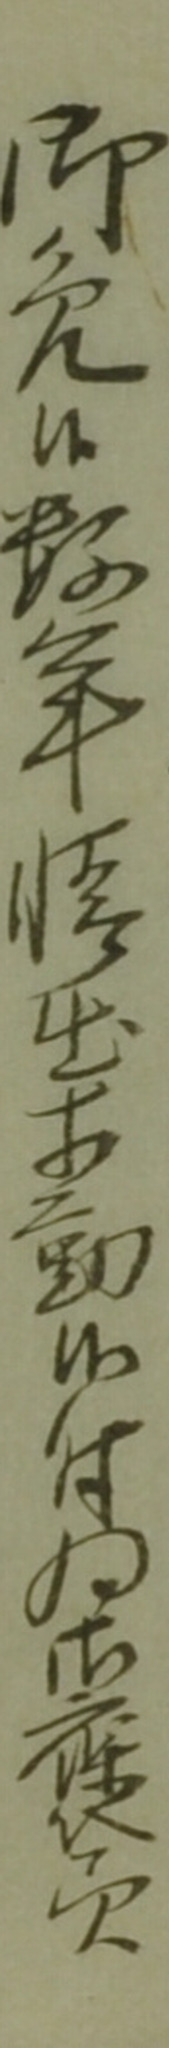御免候数年精出相勤候付為御褒美
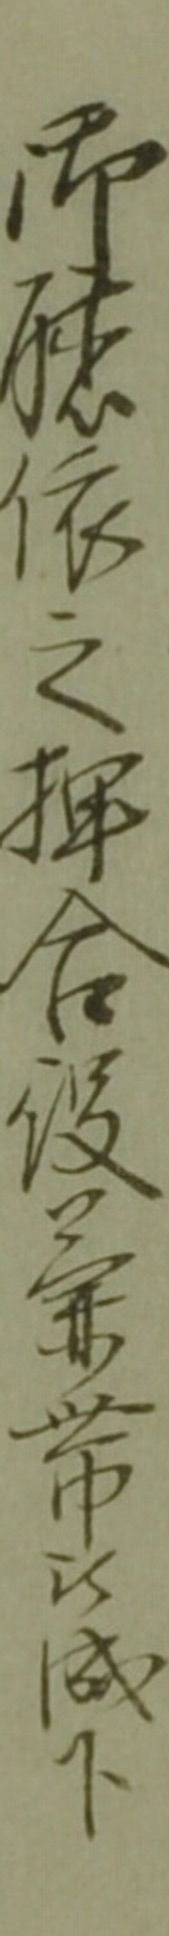御聴依之押合役兼帯被成下
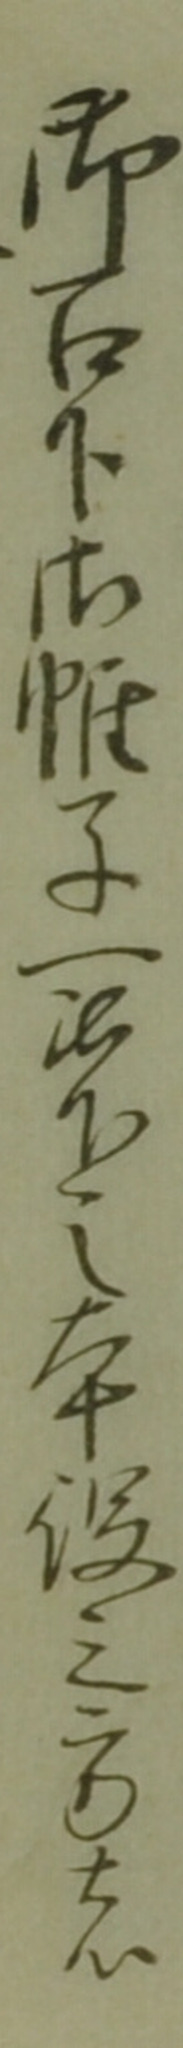御召下御帷子一被下之御役之方者
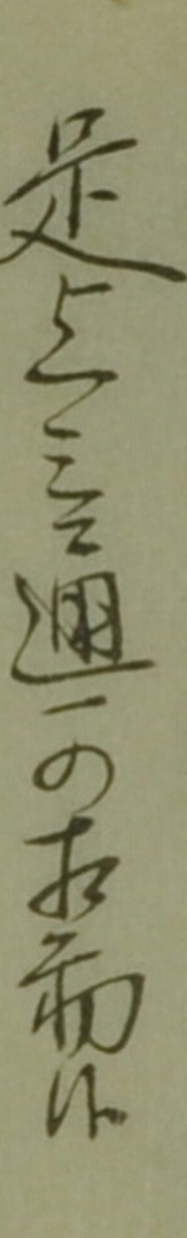是迄之通可相勤候
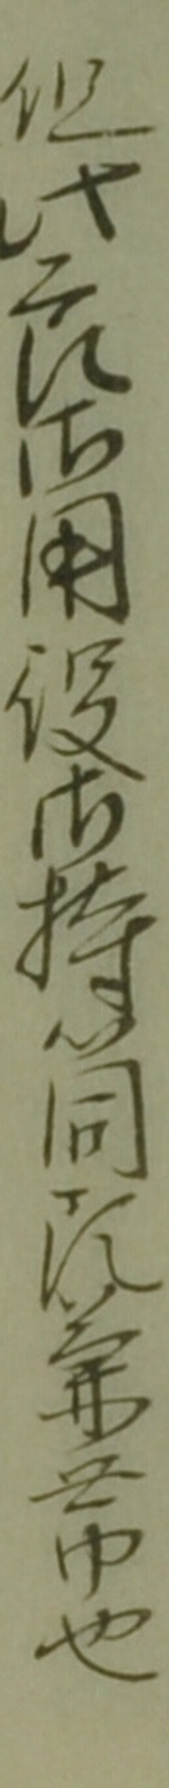但此節御用役御持筒頭兼帯也
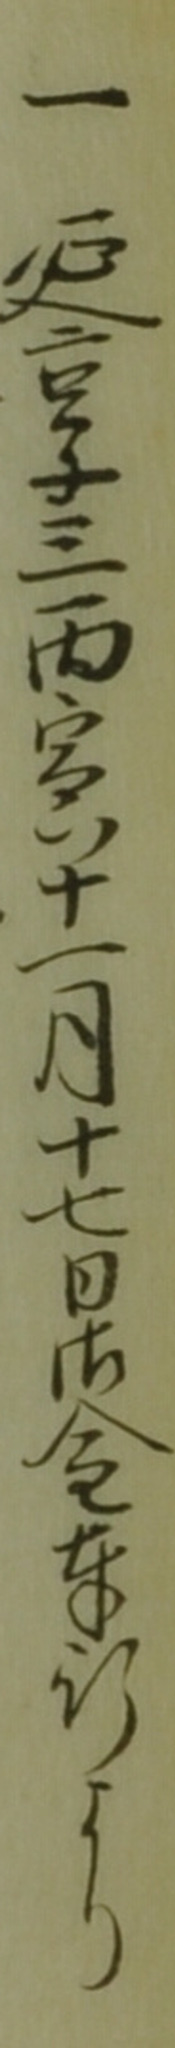一延享三丙寅十一月十七日御金奉行より
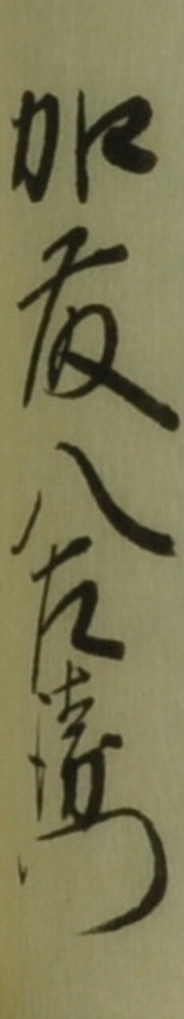加藤八左衛門
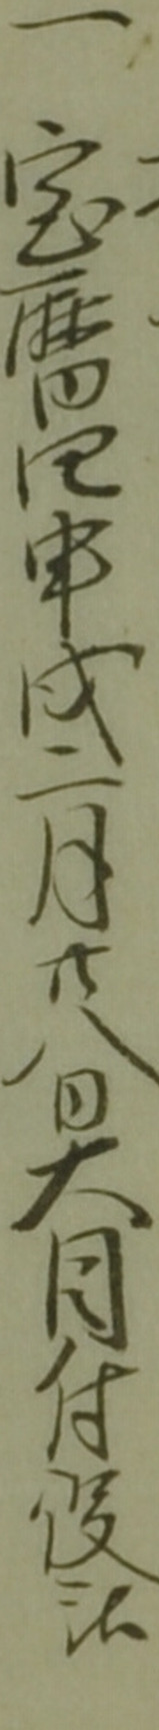一宝暦四甲戌二月廿八日大目付役被
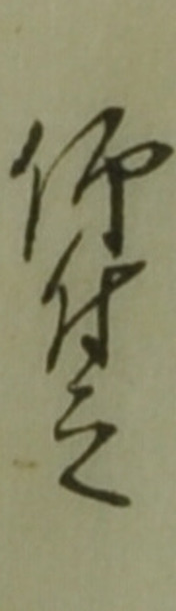仰付之
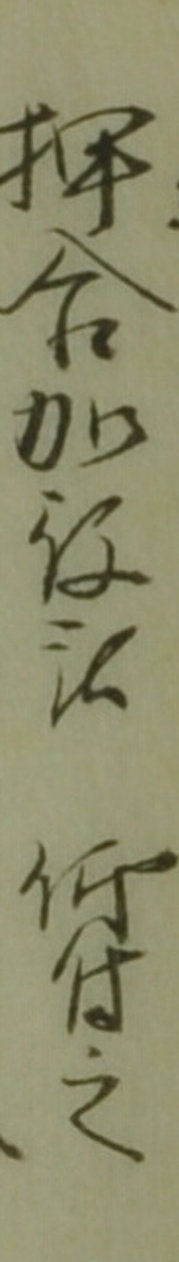押合加役被仰付之
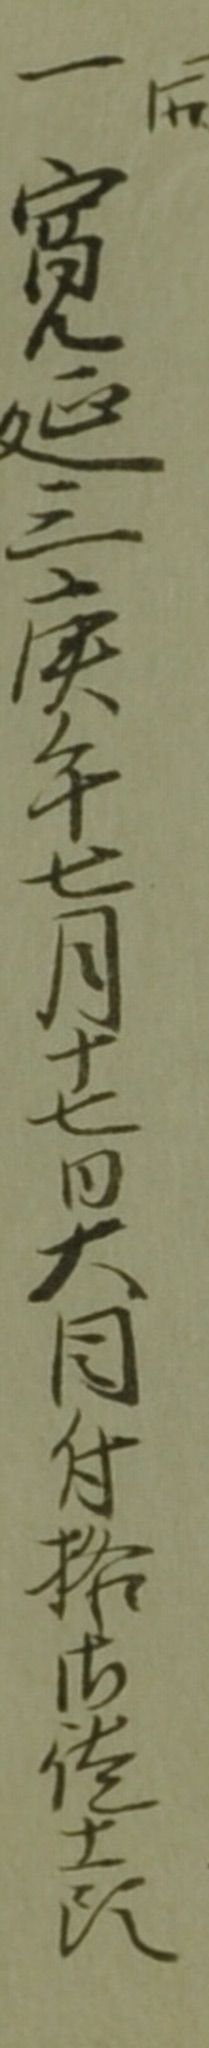一寛延三庚午七月十七日大目付格御徒士頭
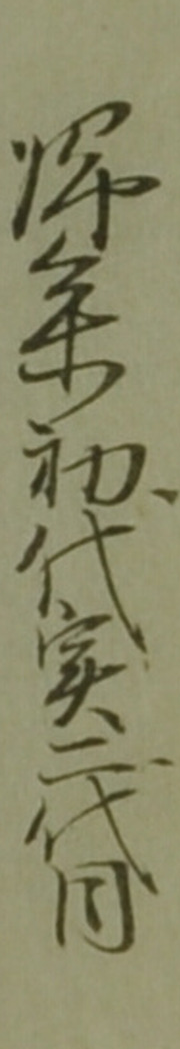帰参初代実二代目
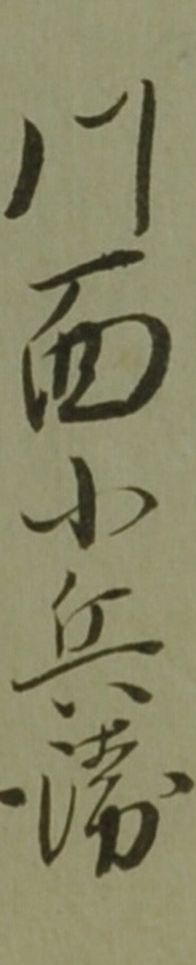川面小兵衛
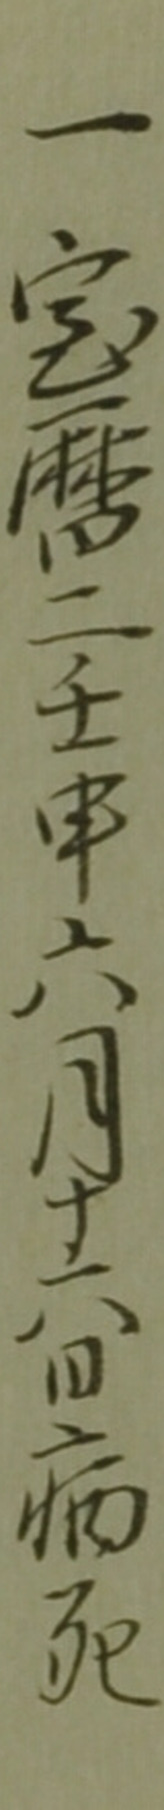一宝暦似壬申六月十六日病死
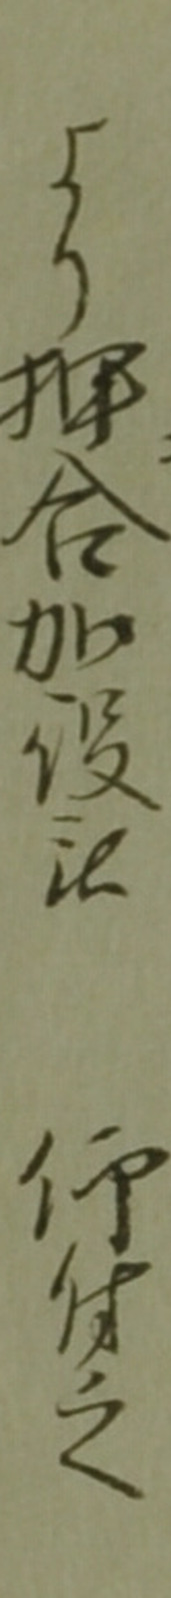より押合加役被仰付之
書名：諸御役代々録（七）
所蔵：伊那市立高遠町図書館・合同会社AMANE
